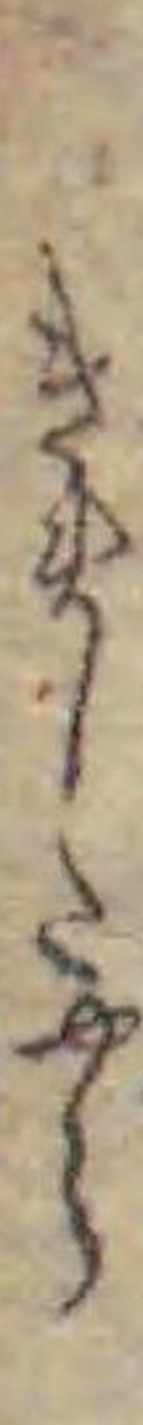きましたやら

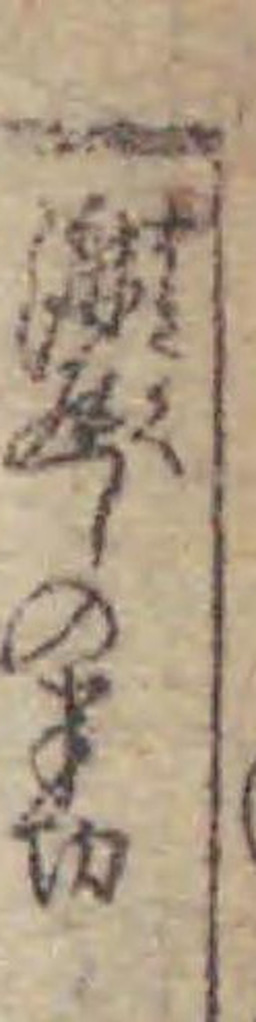漉返しの半切
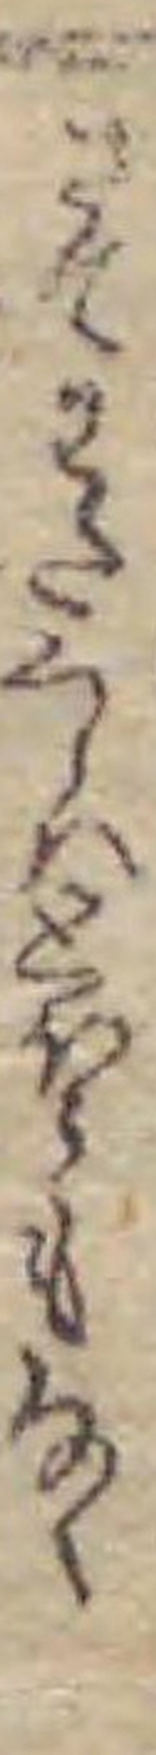さてわたくしはとほうもなく
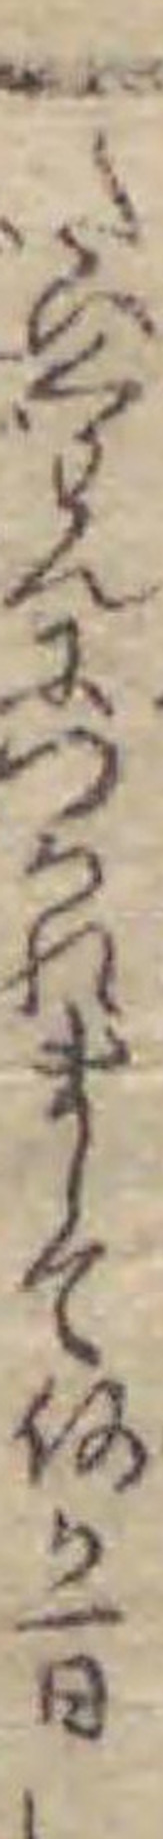たいくわんにつかれまして何か一日
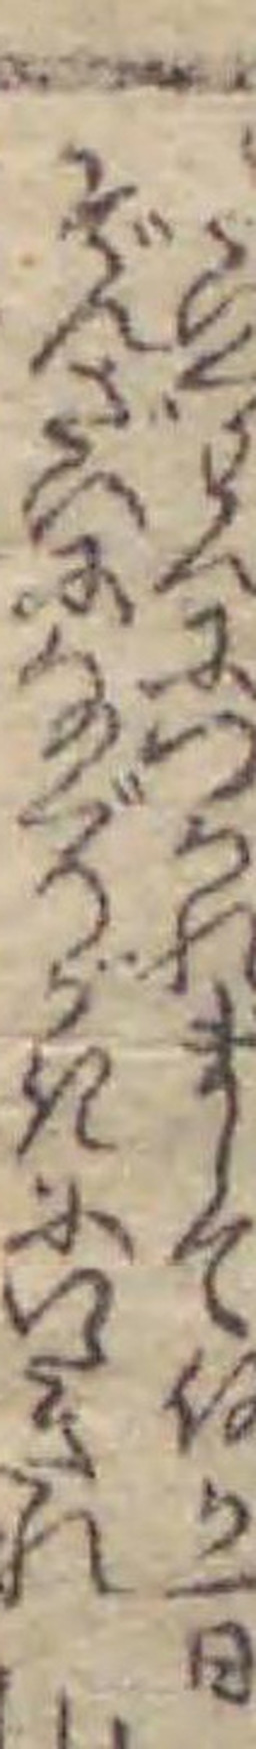ぞんざいになぶりがきにいたされ
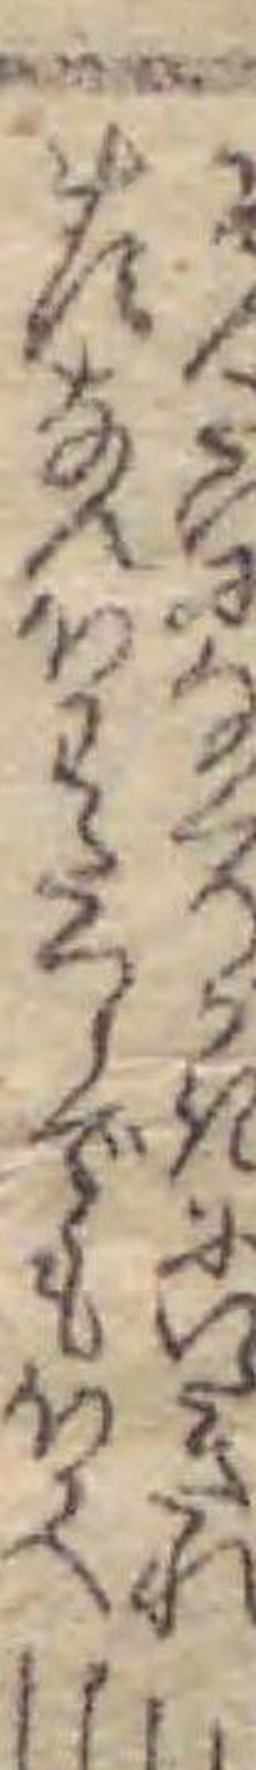ますなんほわたくしでもほかへ
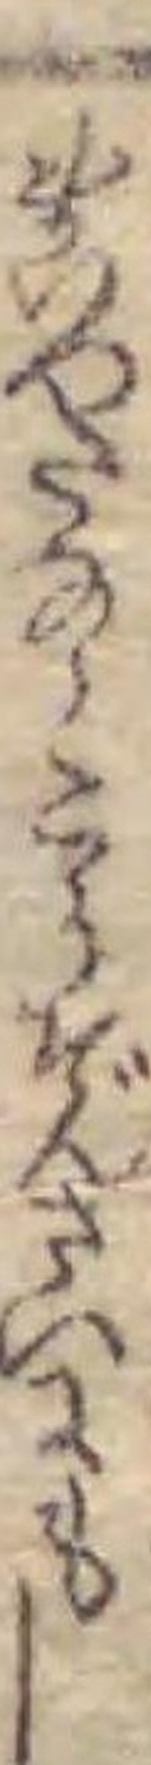まいつたならこうぞんさいにも
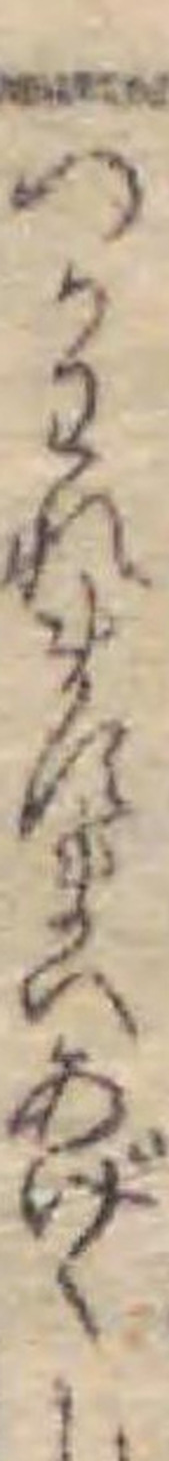つかわれますまいあげく
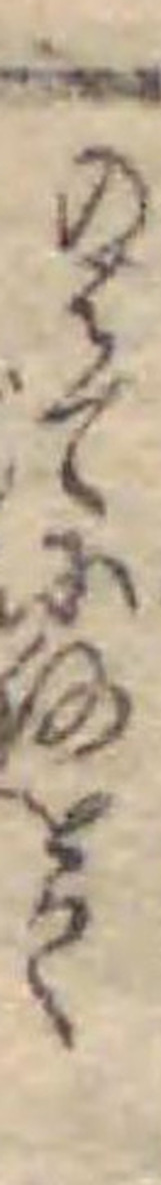のはてに何をかく
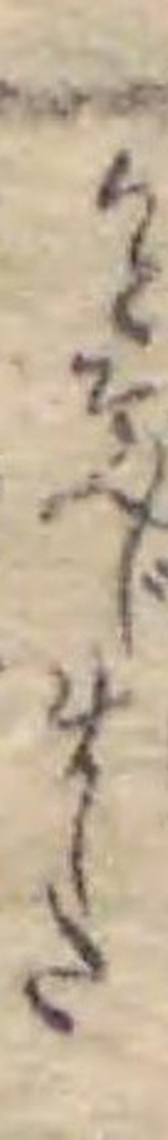かとぞんじました
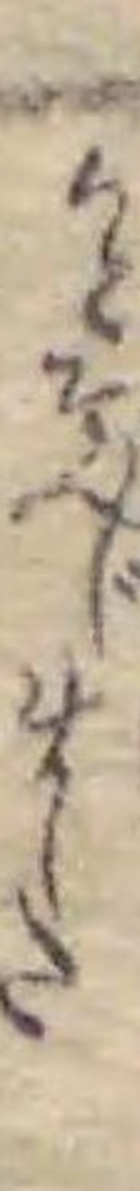かとぞんじました
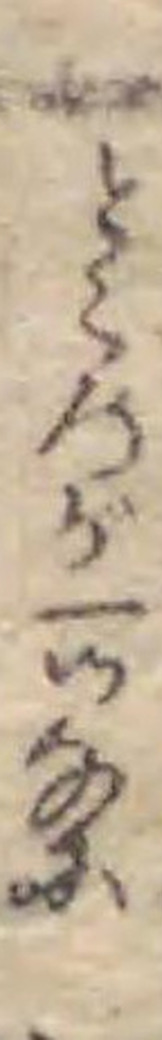ところが一ツなに
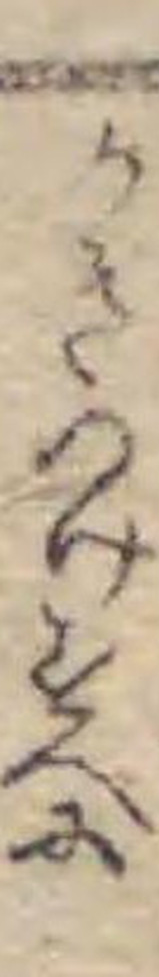かきつけすへに
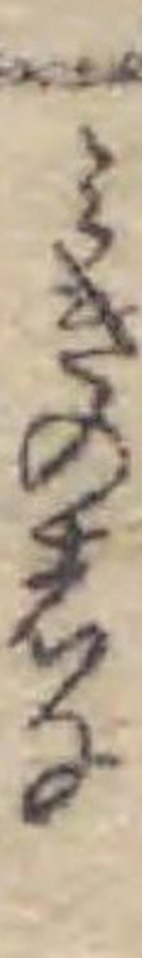みきのしな
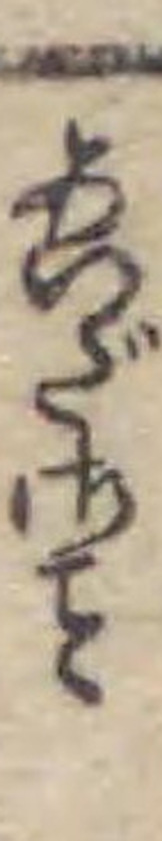あいだ御こと
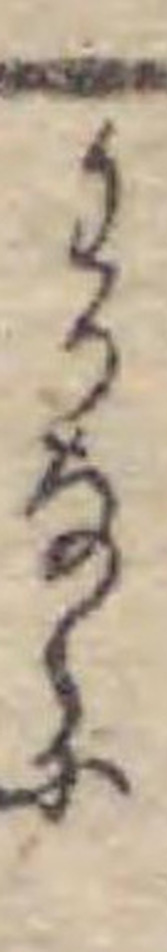わりなくに
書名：紙屑身上噺 : 3巻
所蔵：国立国会図書館 National Diet Library, JAPAN
